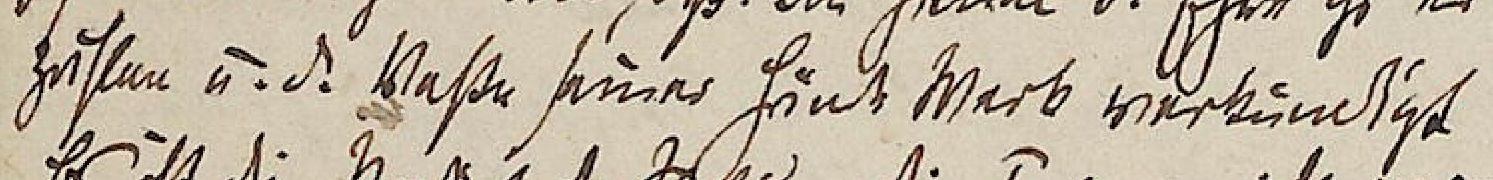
zählen u. d. Veste seiner Hände Werk verkündigt.
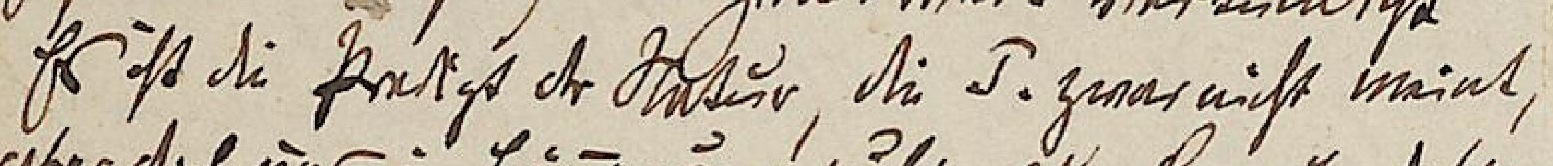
Es ist die Predigt der Natur, die P. zwar nicht meint,
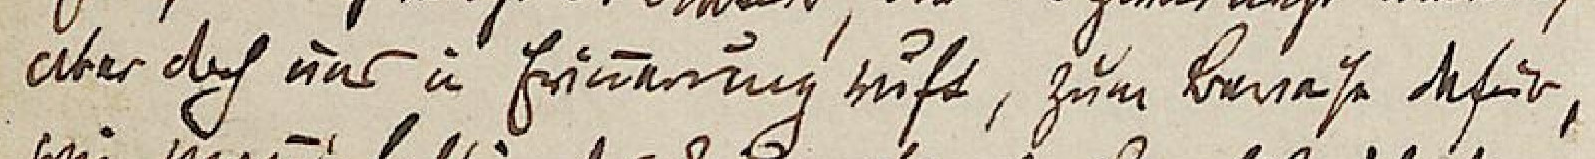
aber doch uns in Erinerung ruft, zum Beweise dafür,
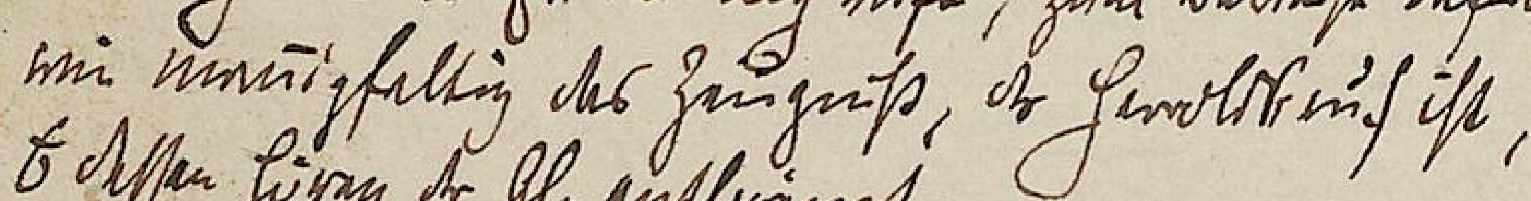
wie manigfaltig das Zeugniß, der Heroldsruf ist
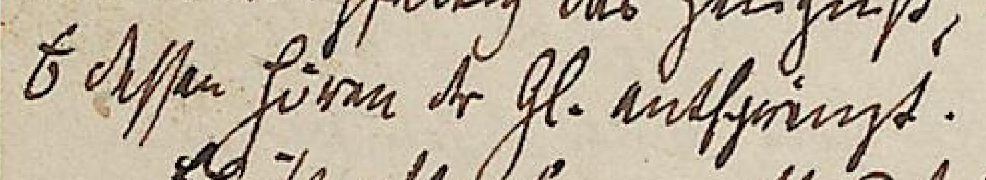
s dessen Hören dr Gl. entspringt.
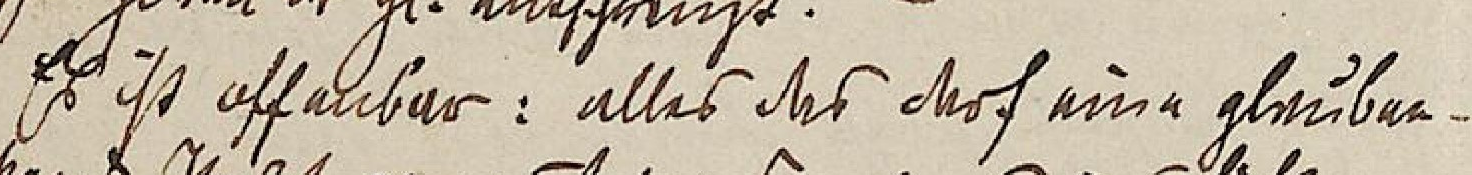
Es ist offenbar: alles das darf eine glauben¬
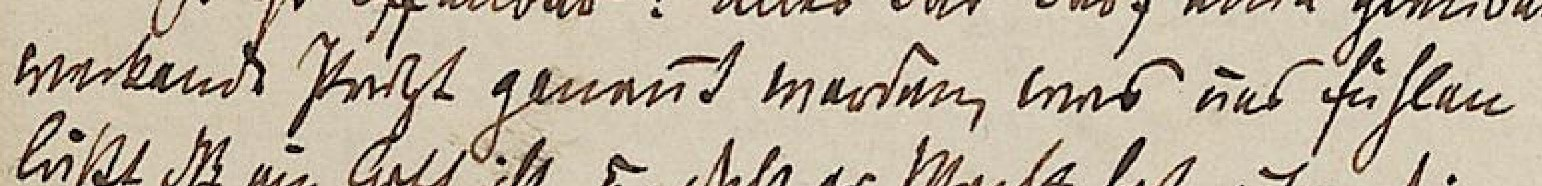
wirkende Predigt genant werden, was uns fühlen
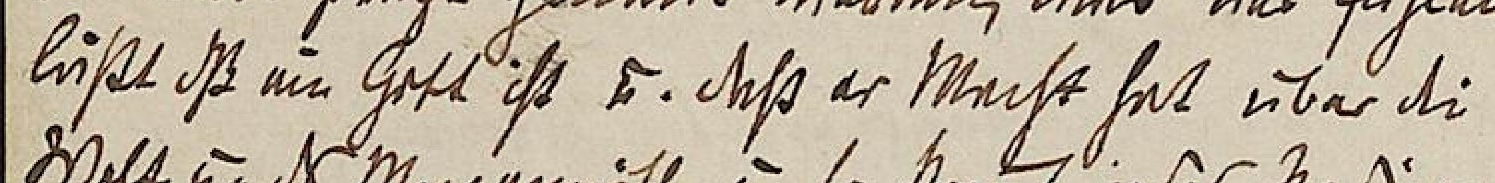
läßt daß ein Gott ist u. daß er Macht hat über die
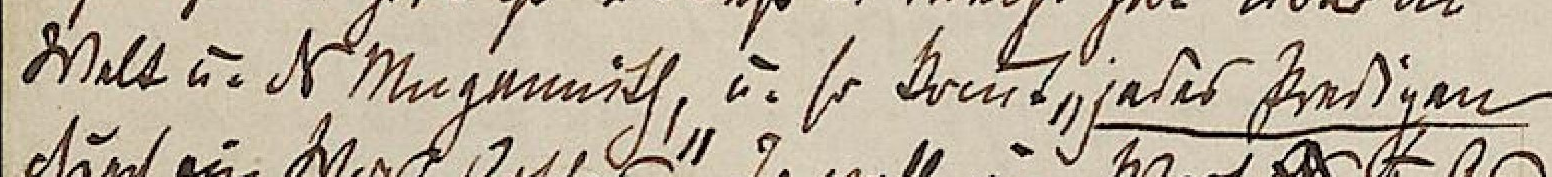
Welt u. das Mngemüth, u. so komt "jedes Predigen
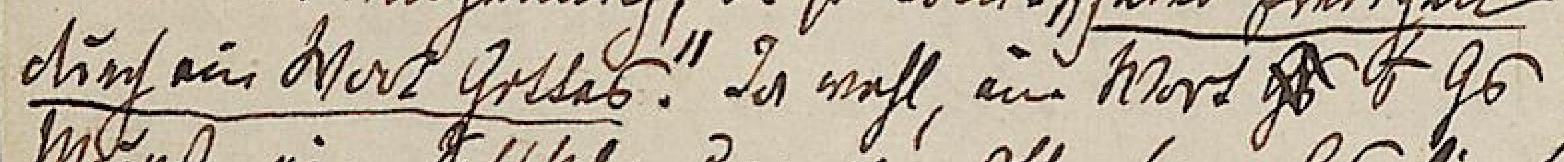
durch ein Wort Gottes." Ja wohl, ein Wort Gs s Gs
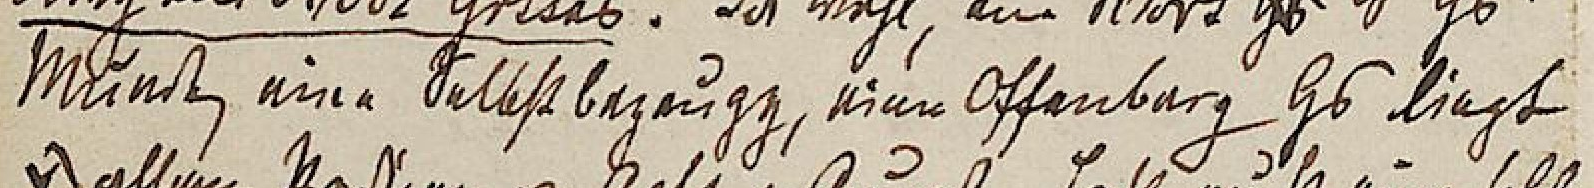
Munde, eine Selbstbezeugg., eine Offenbarg Gs liegt
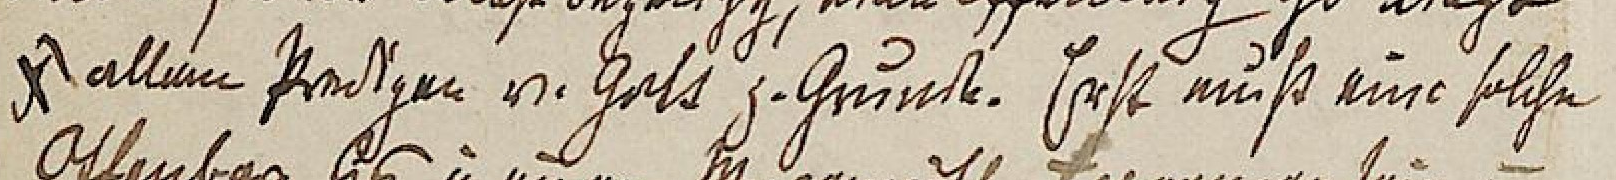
j allem Predigen v. Gott z. Grunde. Erst muß eine solche
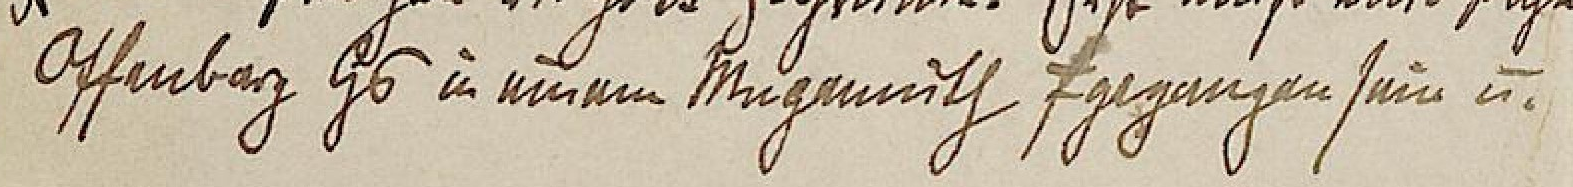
Offenbarg Gs in einem Mngemüth fgegangen sein u.
